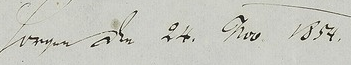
Horgen den 24. Nov. 1854.
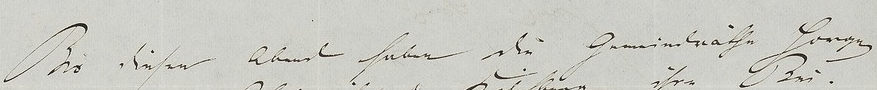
Bis diesen Abend haben die Gemeindräthe Horgen,
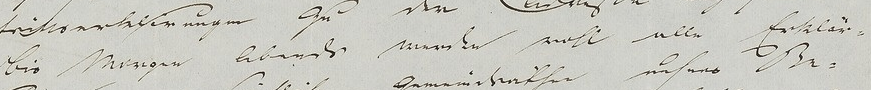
Bis Morgen Abends werden wohl alle Erklär-
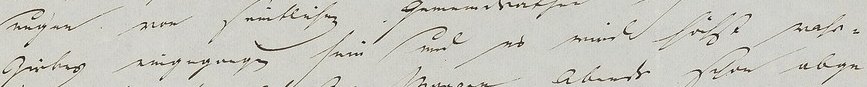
zirkes eingegangen sein und es wird höchst wahr-
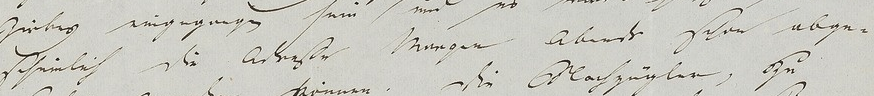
scheinlich die Adresse Morgen Abends schon abge-
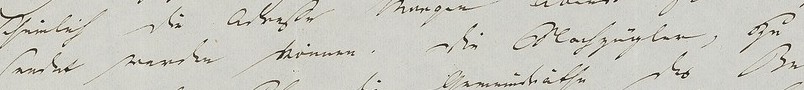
sendet werden können. Die Nachzügler, zu
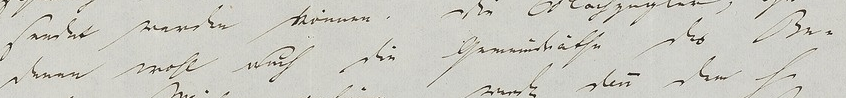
denen wohl auch die Gemeindräthe des Be-
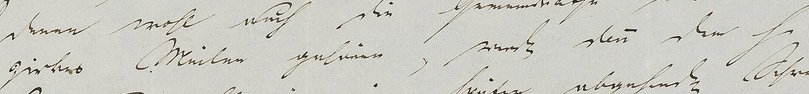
zirkes Meilen gehören, werden dann dem H.
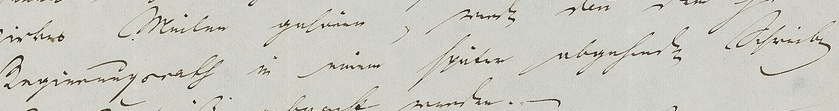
Regierungsrath in einem später abgehenden Schreiben
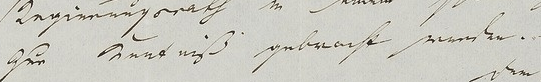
zur Kenntniß gebracht werden. –
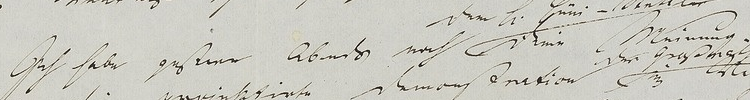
Ich habe gestern Abends noch dem H. Hüni-Stettler
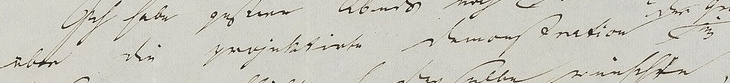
über die projektirte Demonstration der
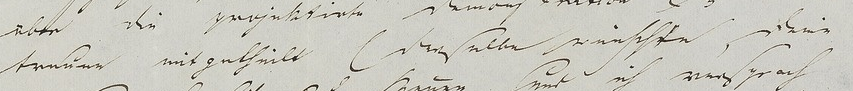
trauen mitgetheilt (derselbe wünschte, deine
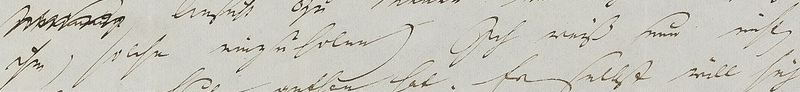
ihm, solche einzuholen) Ich weiß nun nicht,
